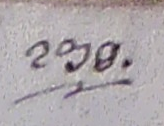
239.
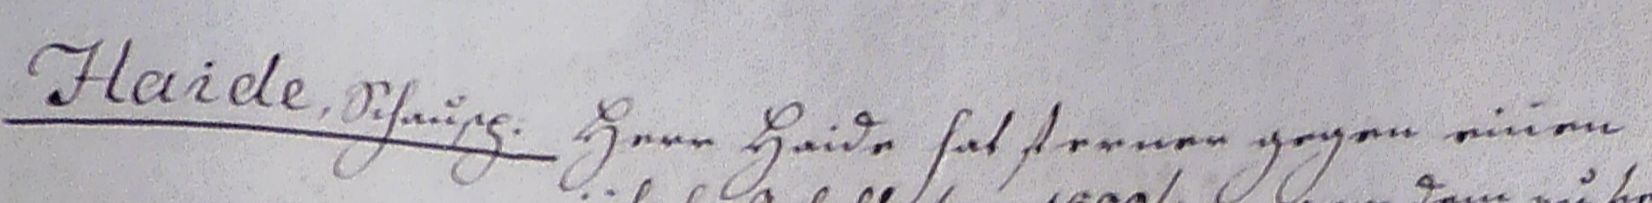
Haide, Schausp. Herr Haide hat ferner gegen einen
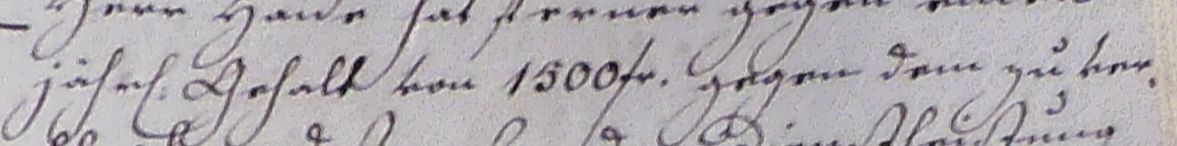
jährl. Gehalt von 1500fr. gegen dem zu ver¬
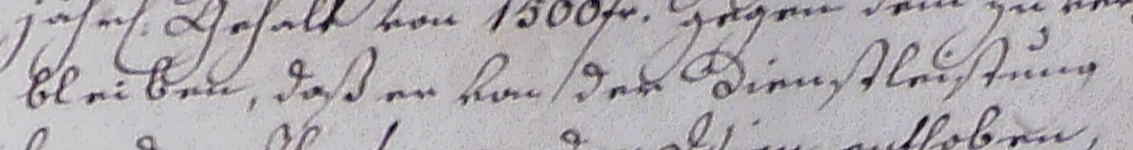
bleiben, daß er von der Dienstleistung
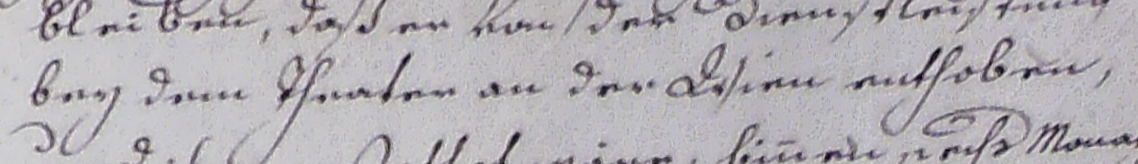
bey dem Theater an der Wien enthoben,
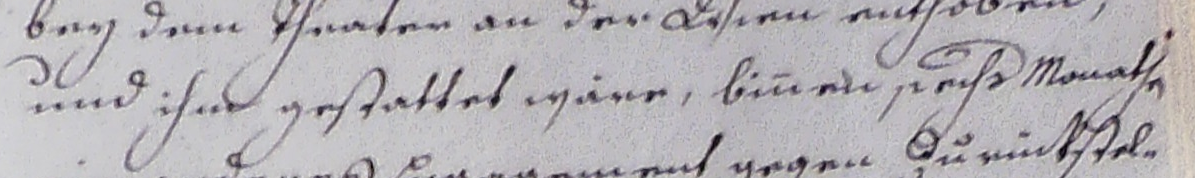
und ihm gestattet wäre, bin̅en, sechs Monathe
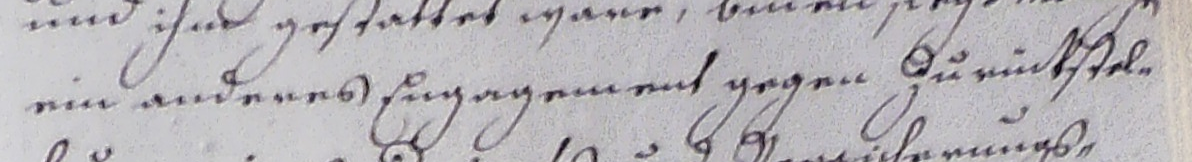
ein anderes Engagement gegen Zurückstel¬
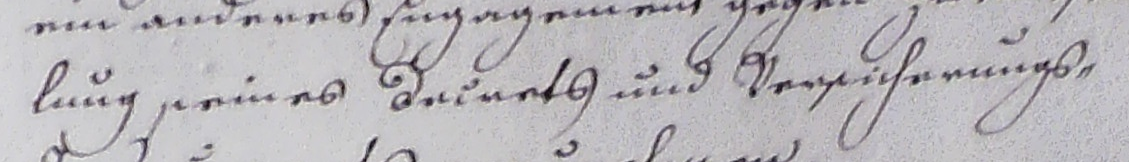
lung seines Decrets und Versicherungs¬
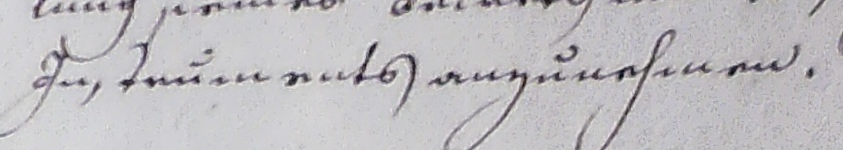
Instruments anzunehmen.
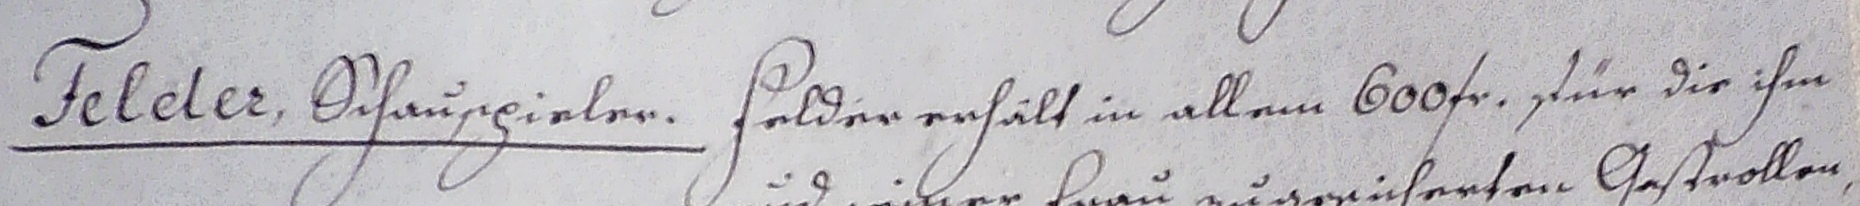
Felder, Schauspieler. Felder erhält in allem 600fr. für die ihm
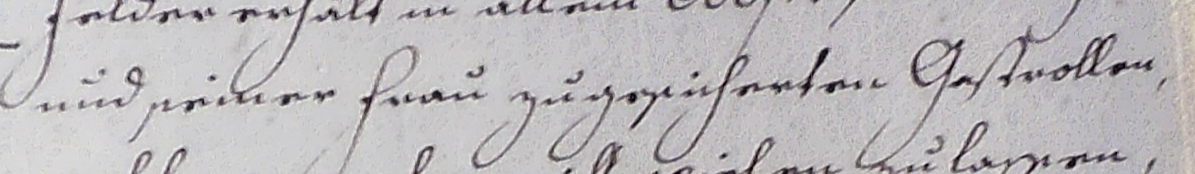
und seiner Frau zugesicherten Gastrollen,
